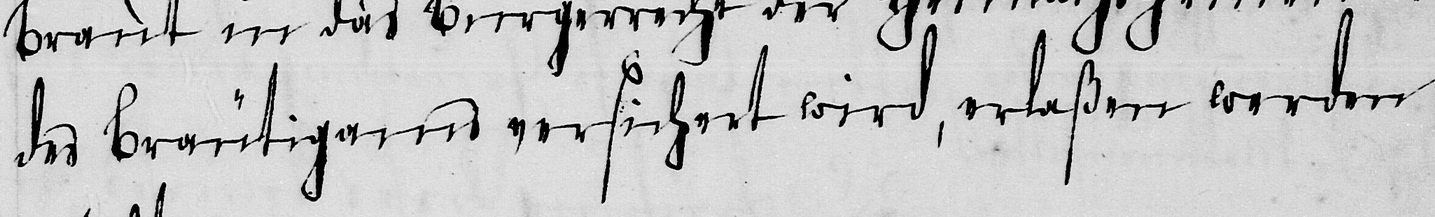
des Bräutigams versichert wird, erlaßen werden
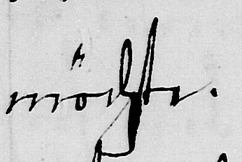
möchte.
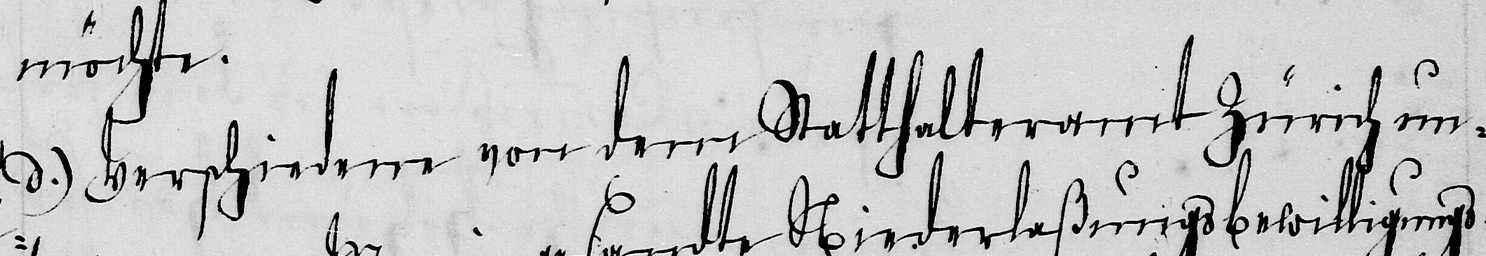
d.) Verschiedene von dem Statthalteramt Zürich un¬
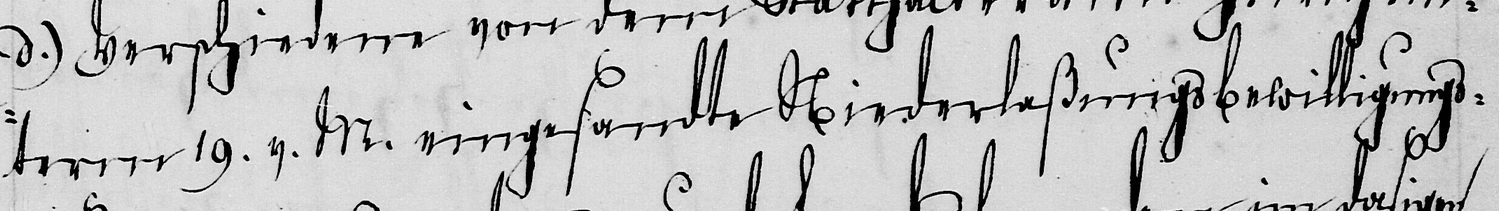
term 19. v. M. eingesandte Niederlaßungsbewilligungs¬
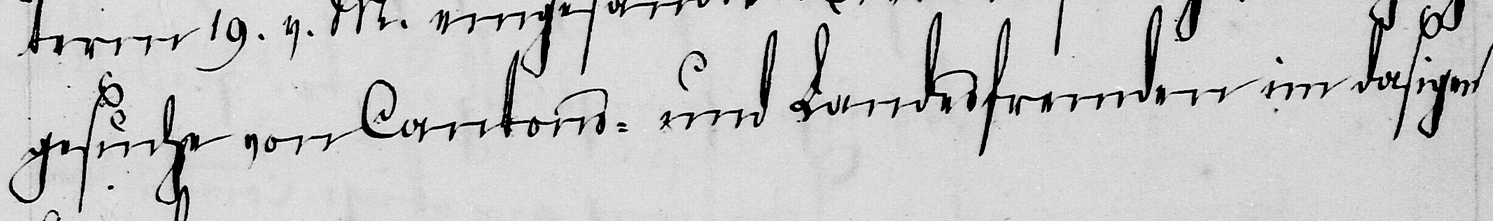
gesuche von Cantons- und Landesfremden im dasigen
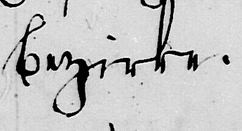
Bezirke.
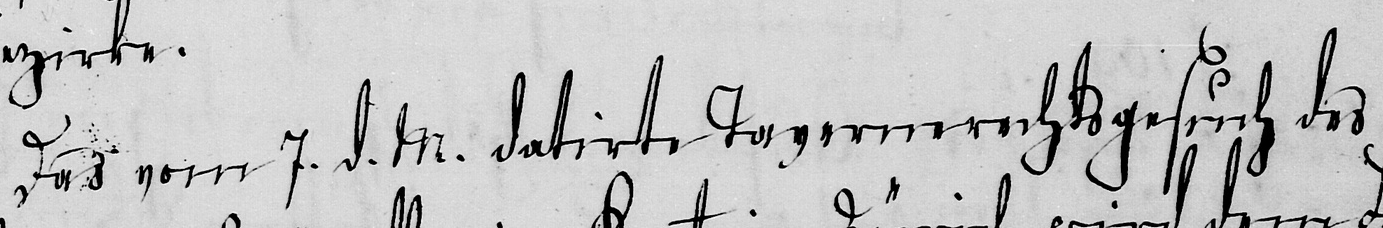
Das vom 7. d. M. datirte Tavernerechtsgesuch des
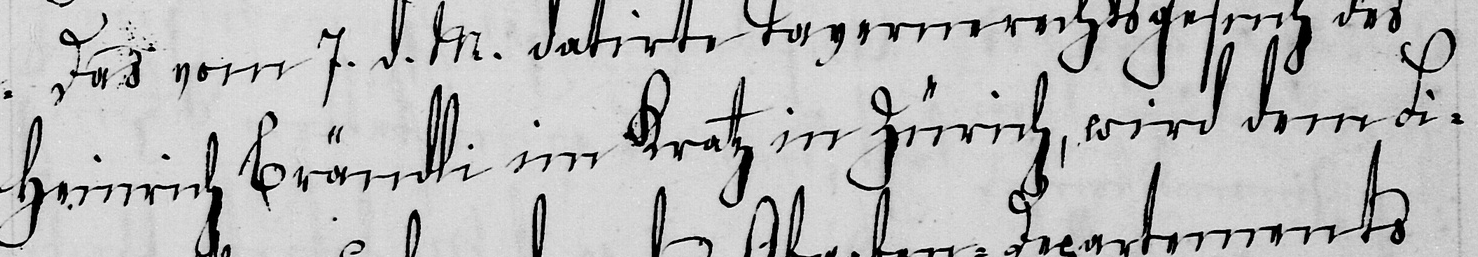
Heinrich Brändli im Kratz in Zürich, wird dem Fi¬
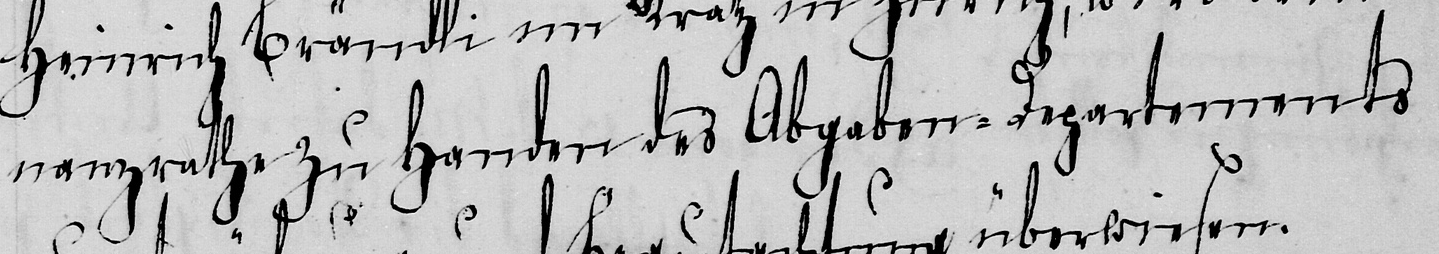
nanzrathe zu Handen des Abgaben-Departements
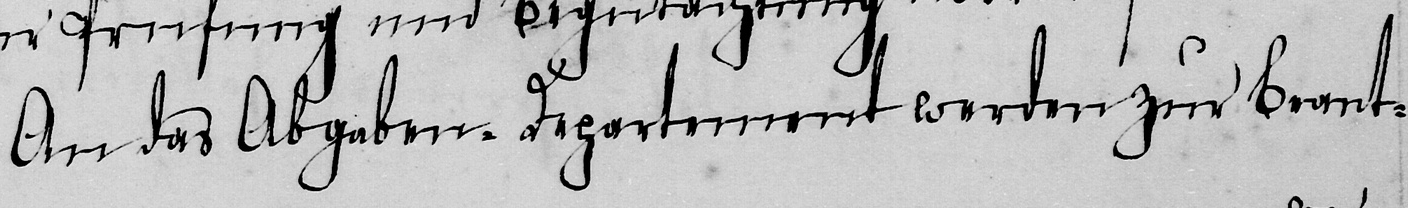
An das Abgaben-Departement werden zur Beant-
